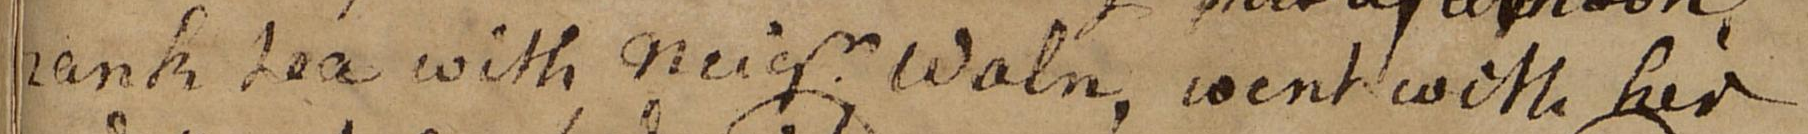rank tea with Neig^r. Waln, went with her
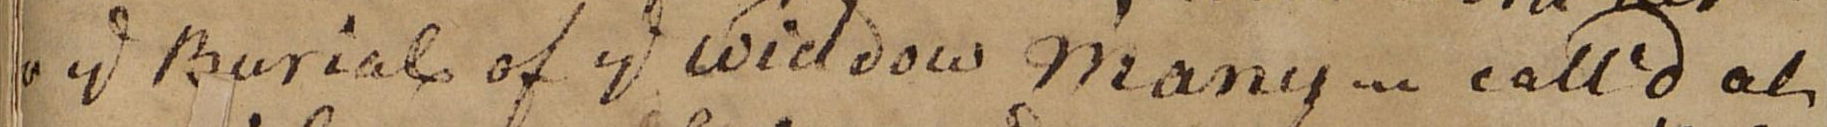o y^e Burial of y^e widdow Many- call'd at
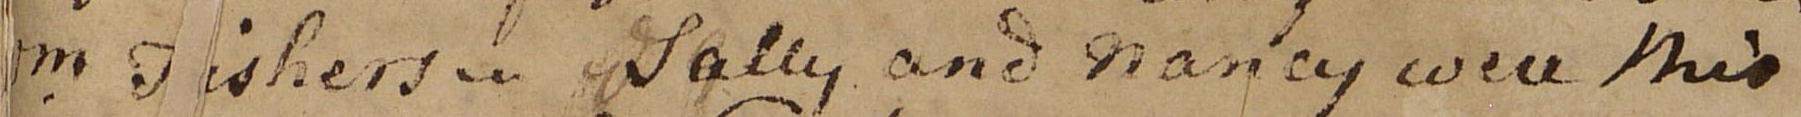M Fishers- y^e Sally and Nancy were this
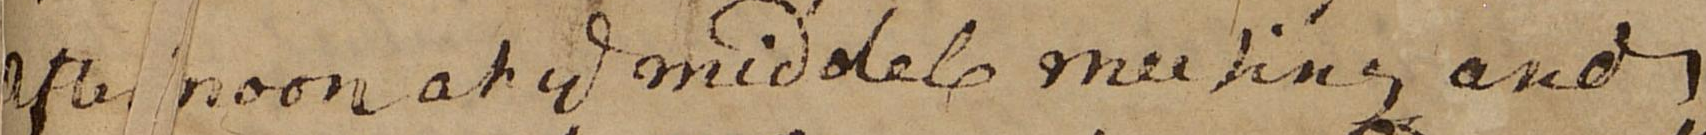Afternoon at y^e middel meeting and
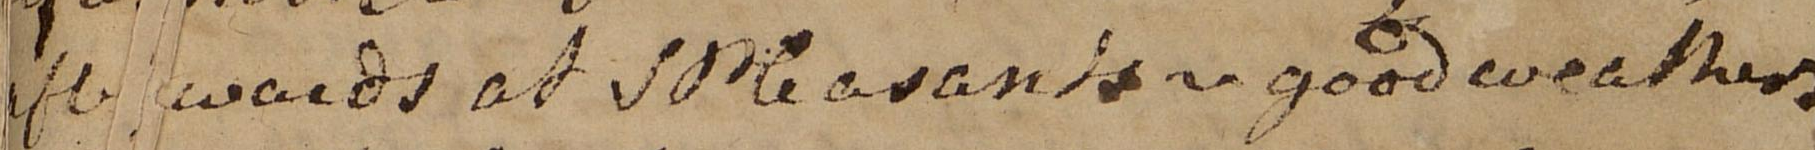afterwards at S Pleasants- good weather
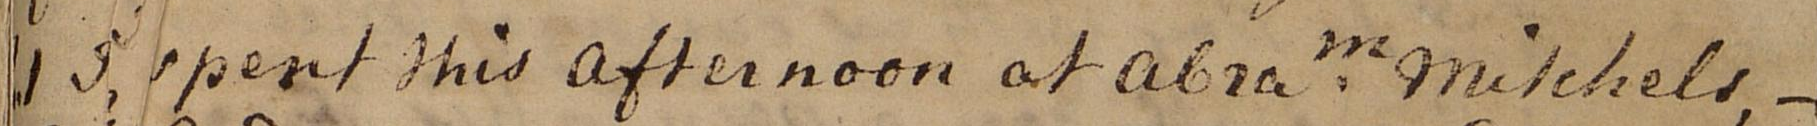13 spent this afternoon at Abra^m Mitchels,-
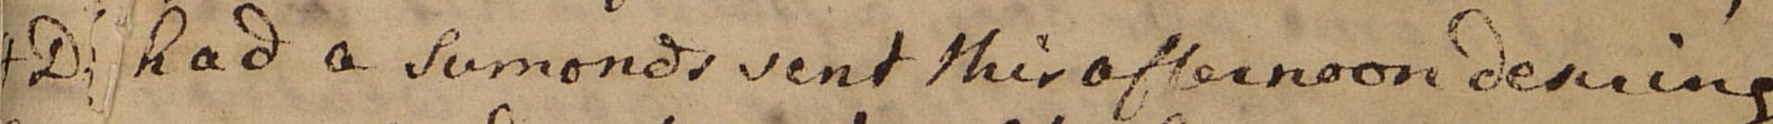D had a sumonds sent this afternoon desiring
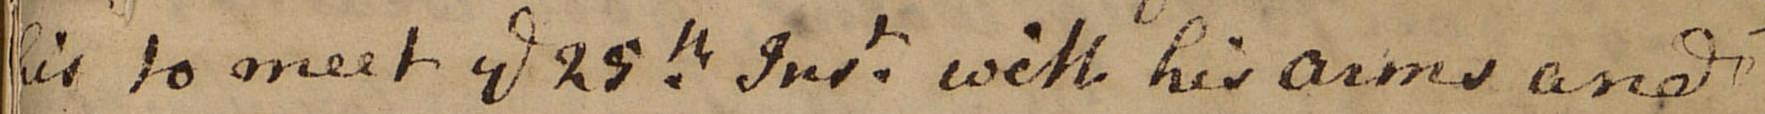his to meet y^e 25^th. Jus^t. with his arms and
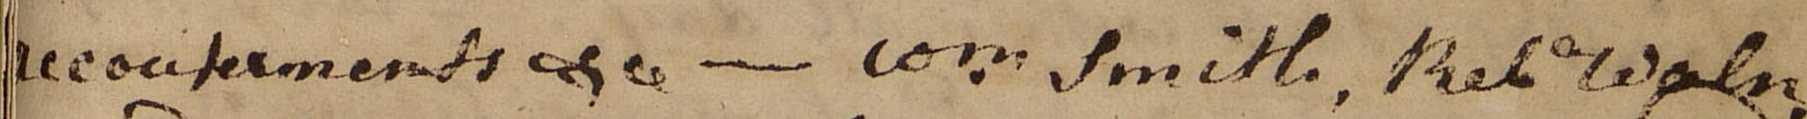recouterments &c- W^m. Smith, Reb^a Waln,
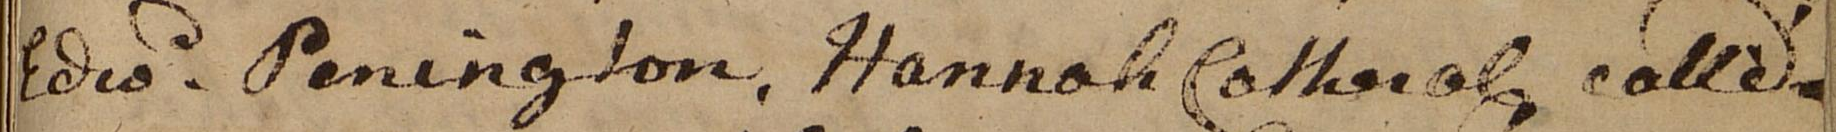Edw^d Penington, Hannah Catheral, call'd
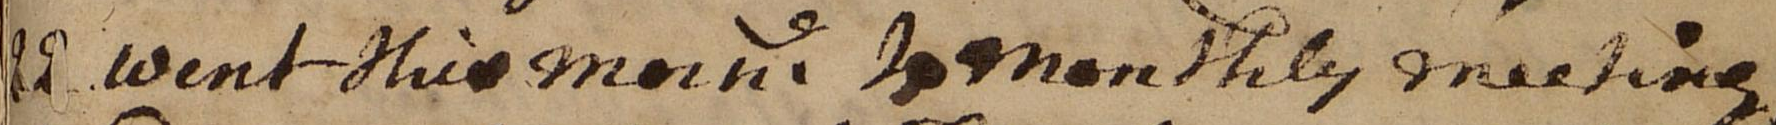22 went this morn^g. to monthly meeting,
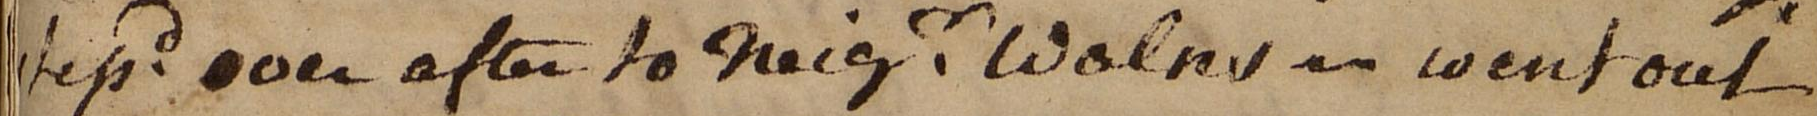step^d over after to Neig^r. Walns- went out
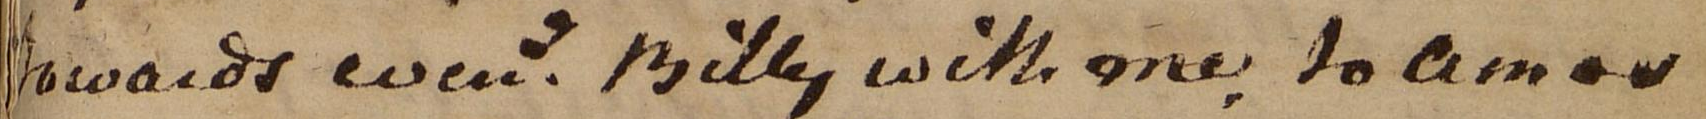towards even^g. Billy with me, to Amos
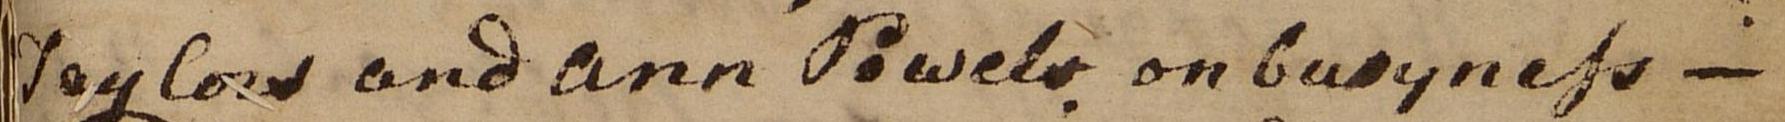Taylors and Ann Powels on busyness-
